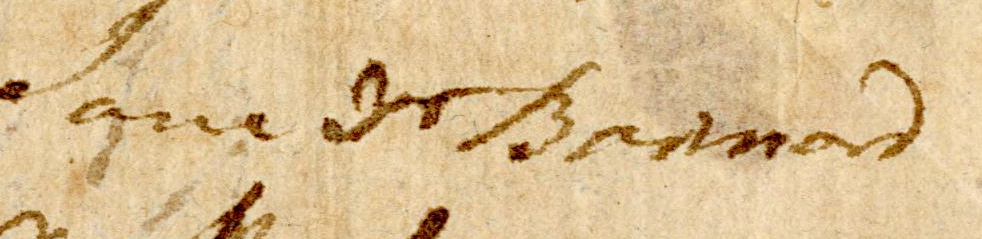I am Y^r Barnard
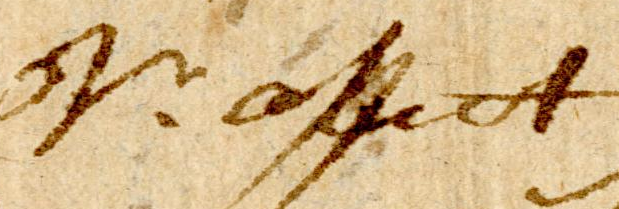Y^r. affect
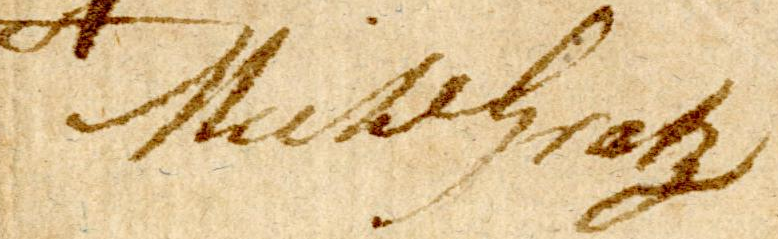Mich^l Gratz
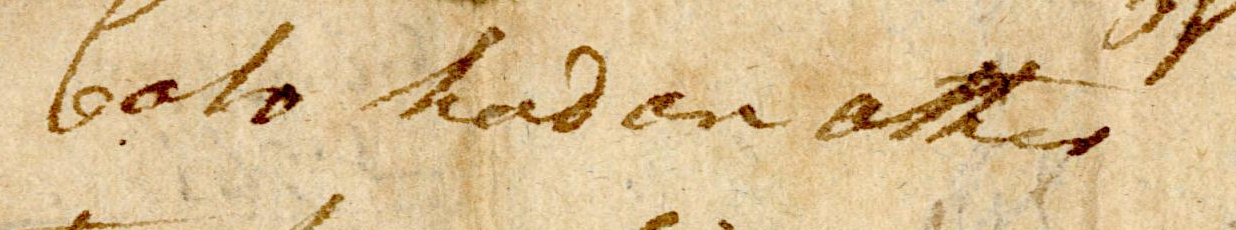Cato had on other
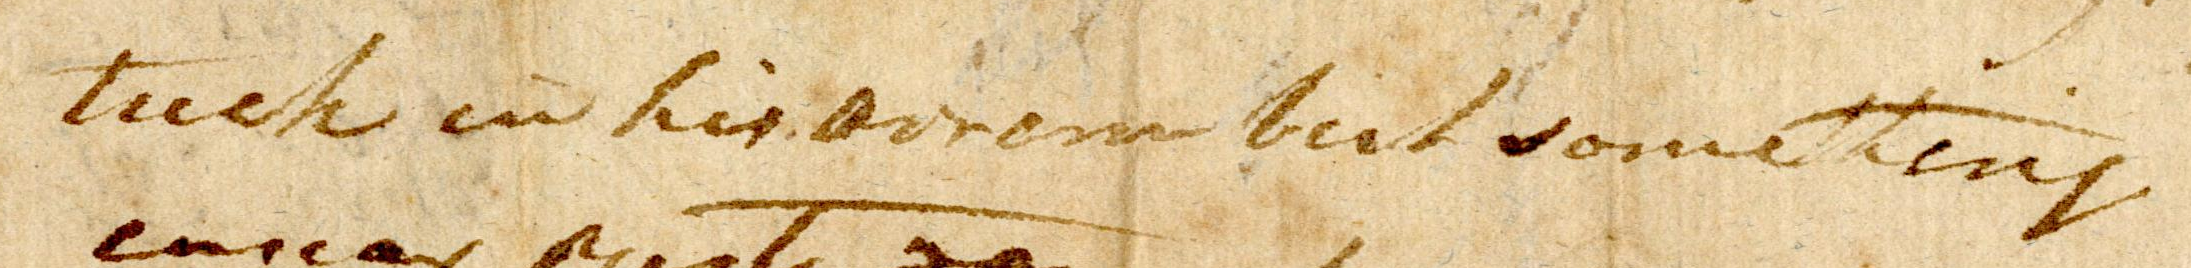tuch in his avern but something
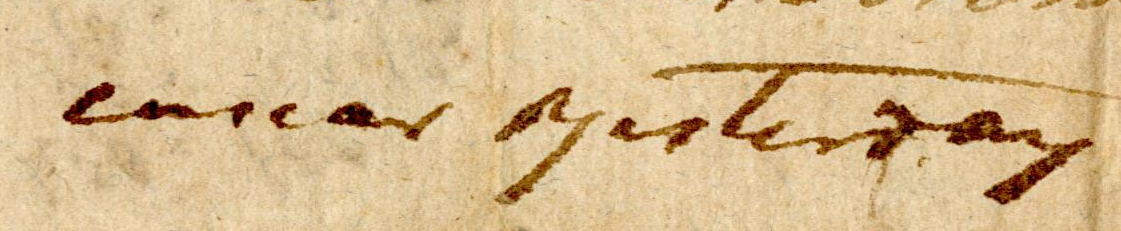came yesterday
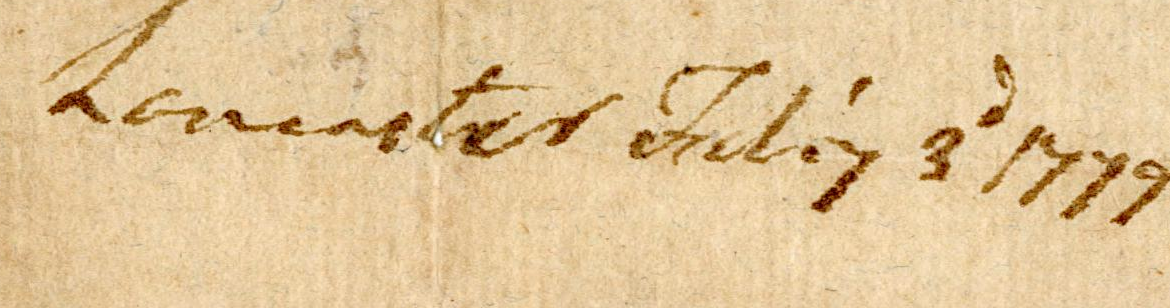Lancaster, Feb^y 3^d 1779
